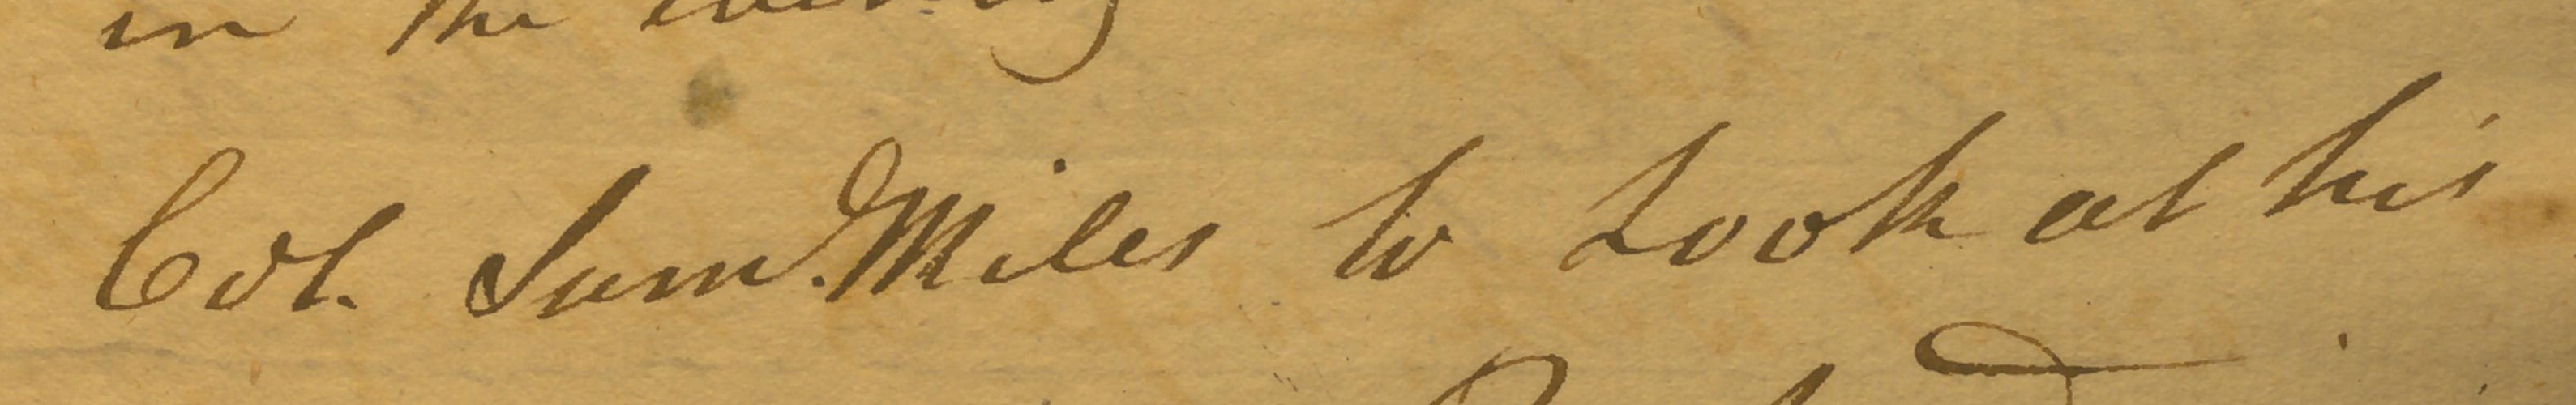Col. Sam^l. Miles to Look at his
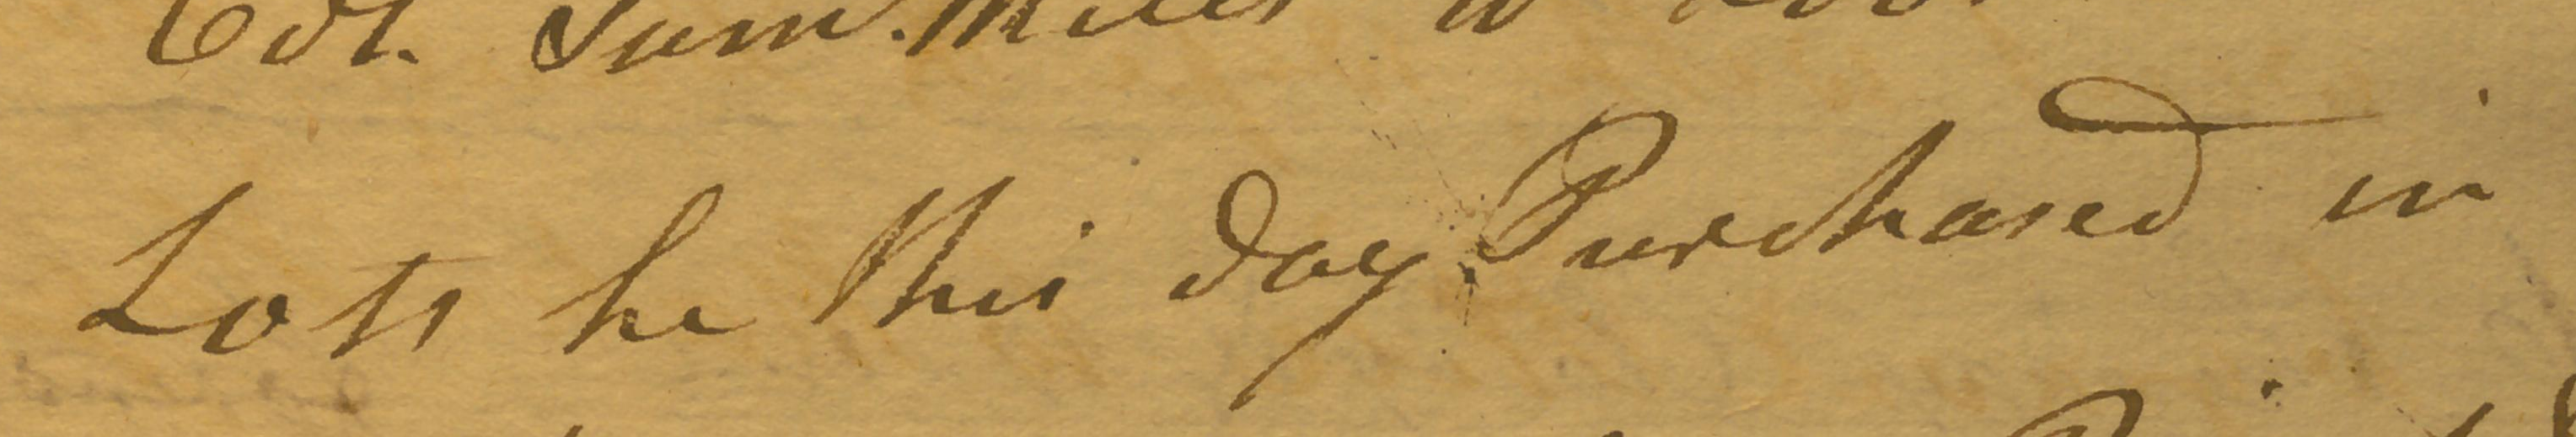Lots he this day Purchased, in
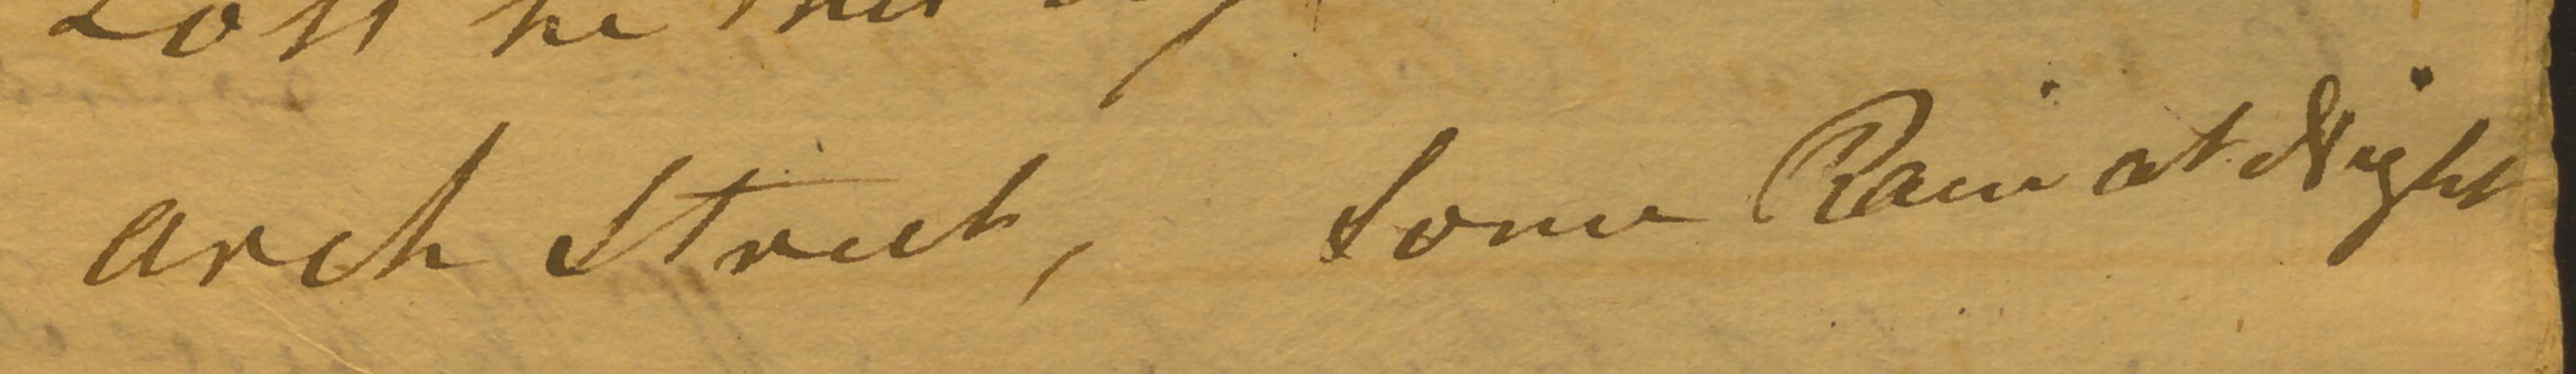arch Street, some Rain at Night
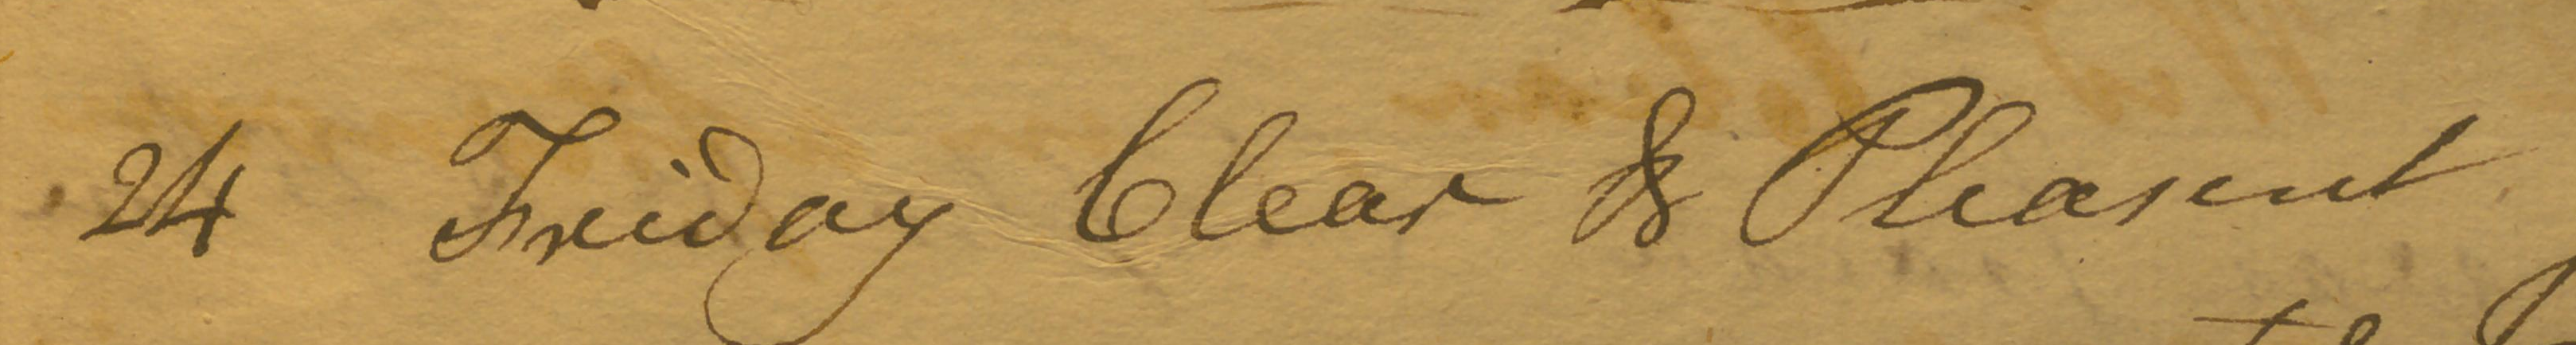24 Friday Clear & Pleasent
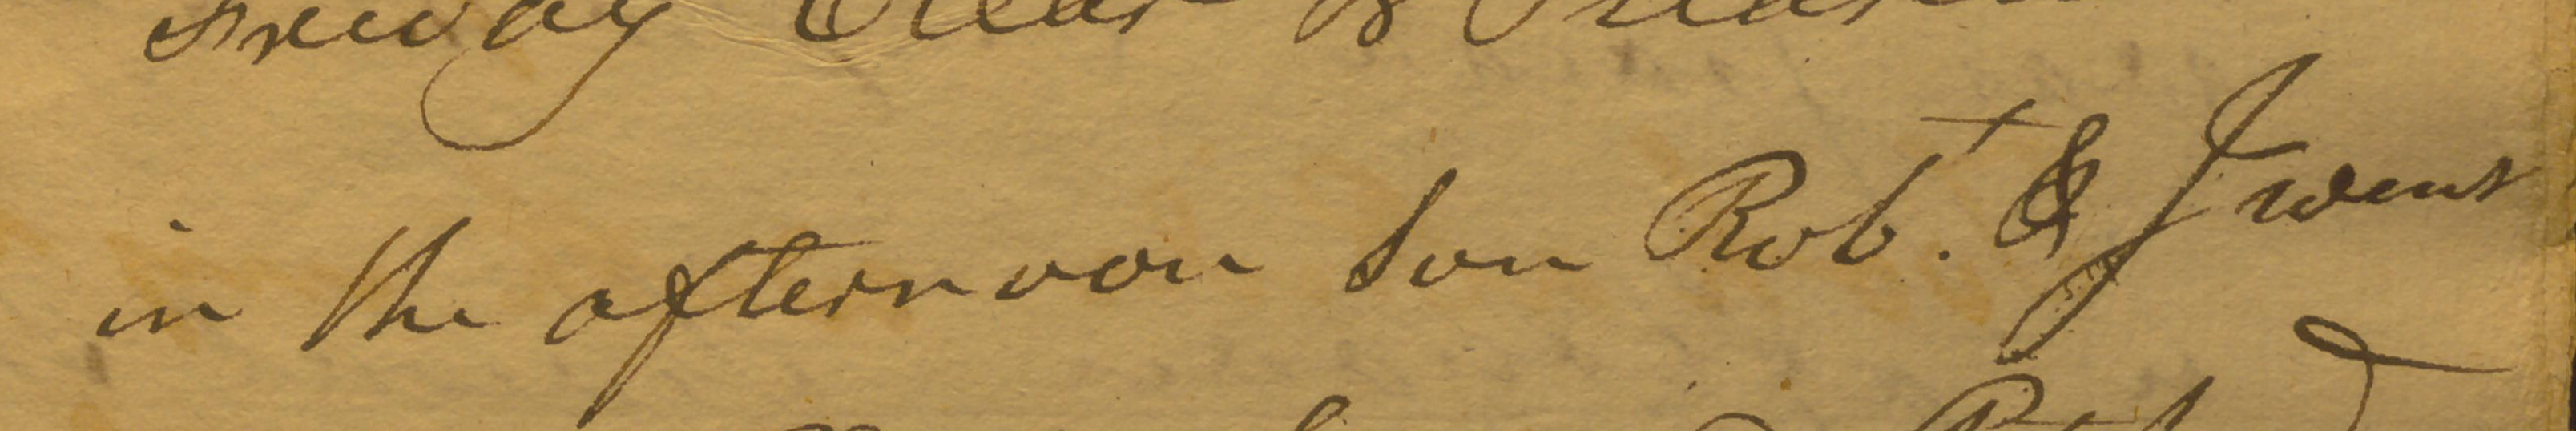in the afternoon Son Rob^t. & I went
